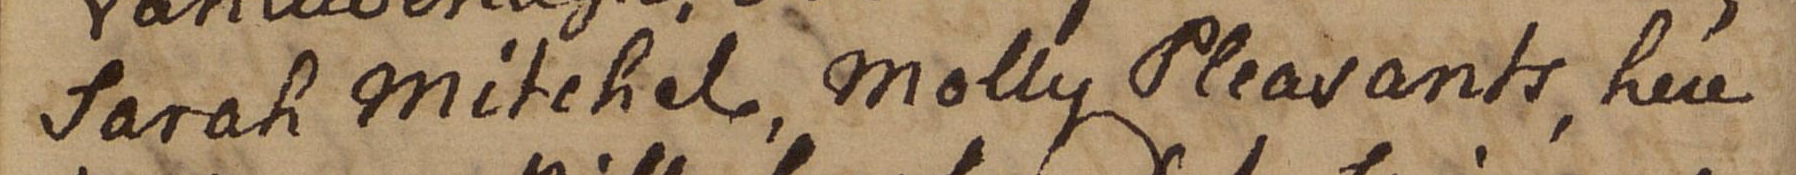Sarah Mitchel, Molly Pleasants, here
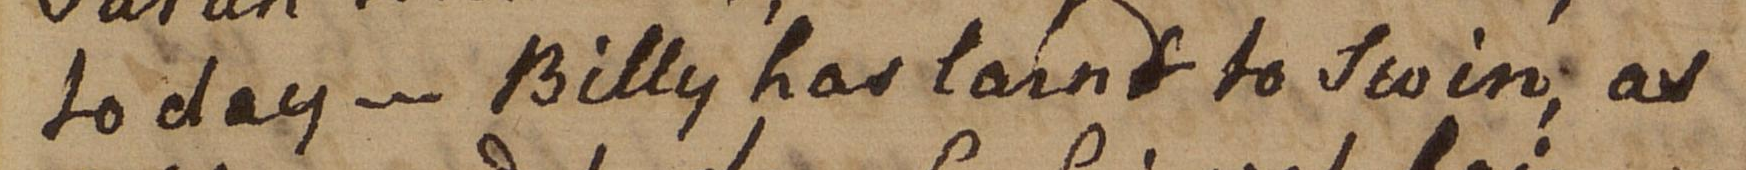to day- Billy has larnt to Swim, as
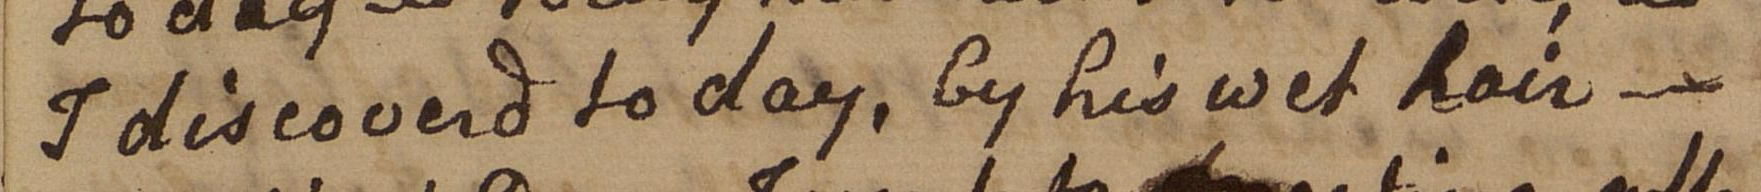I discoverd to day, by his wet hair-
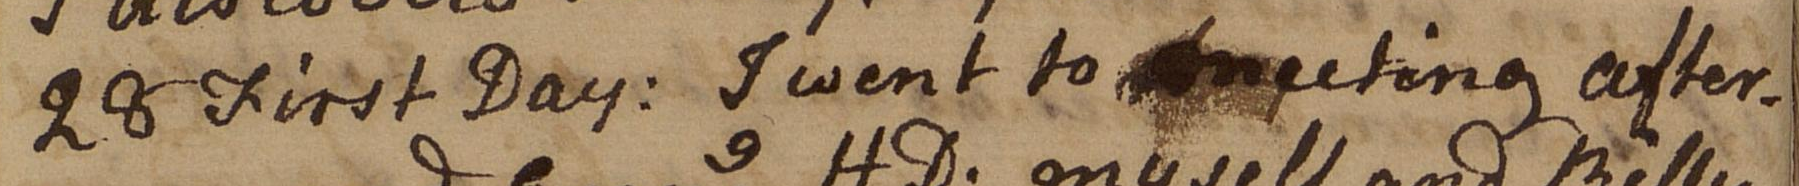28 First Day: I went to meeting after-
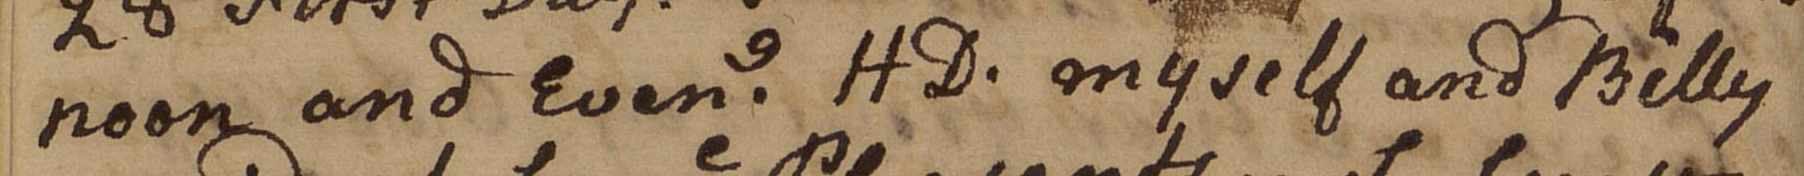noon and Even^g. HD myself and Billy
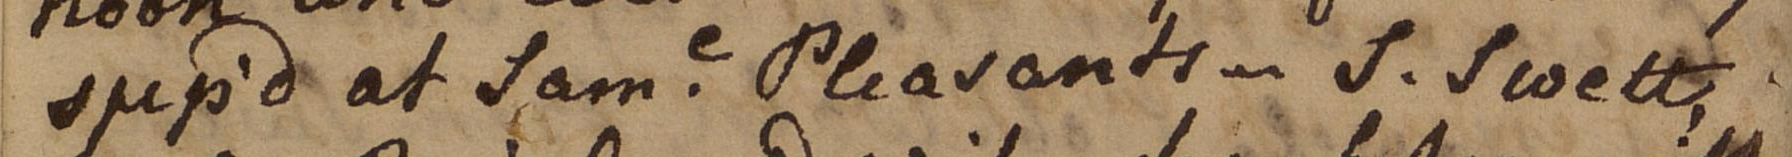sup'd at Sam^l. Pleasants- S. Swett,
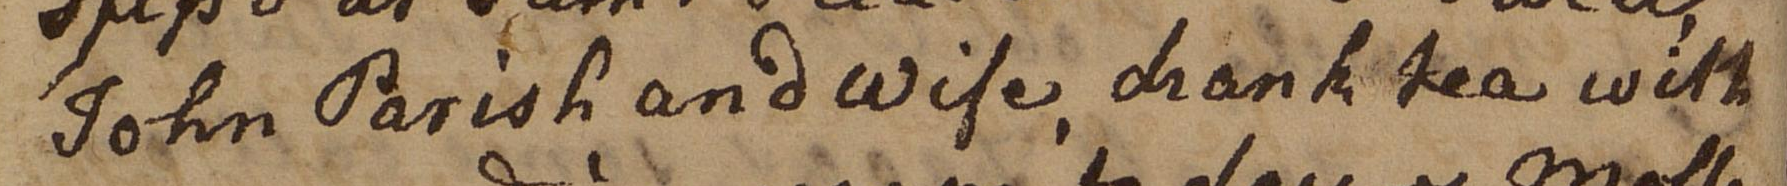John Parish and wife, drank tea with
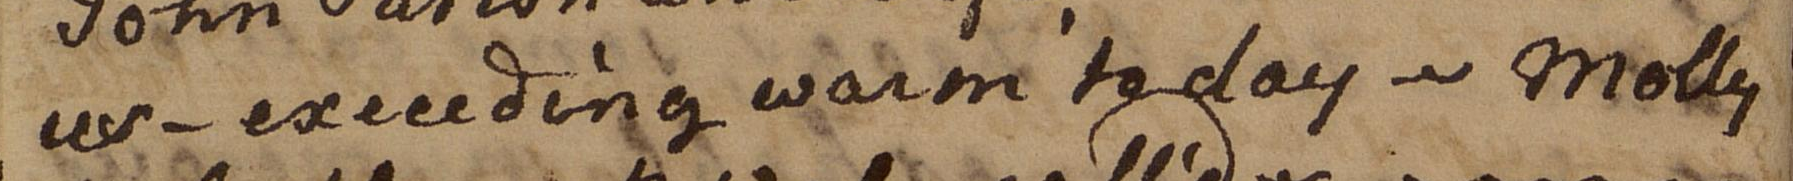us- exceeding warm today- Molly
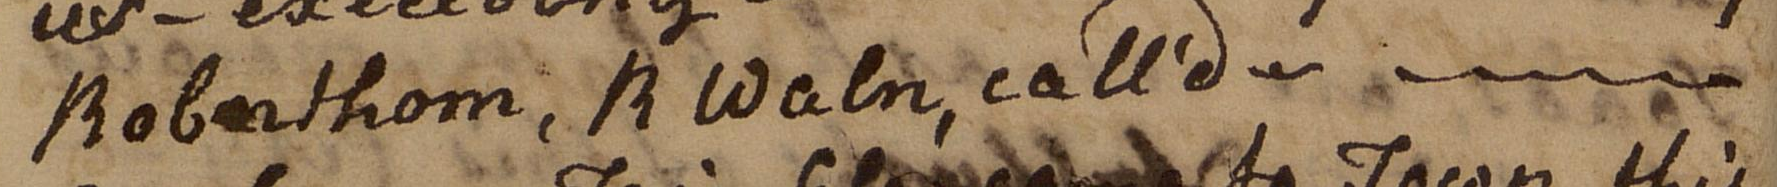Roberthom, R Waln, call'd- -
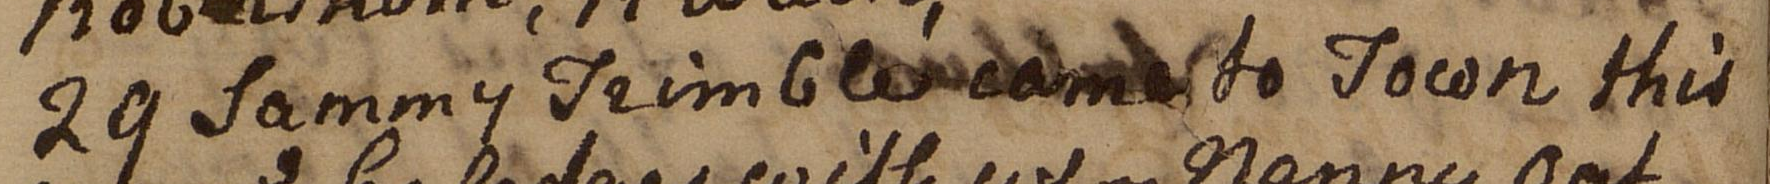29 Sammy Trimble came to Town this
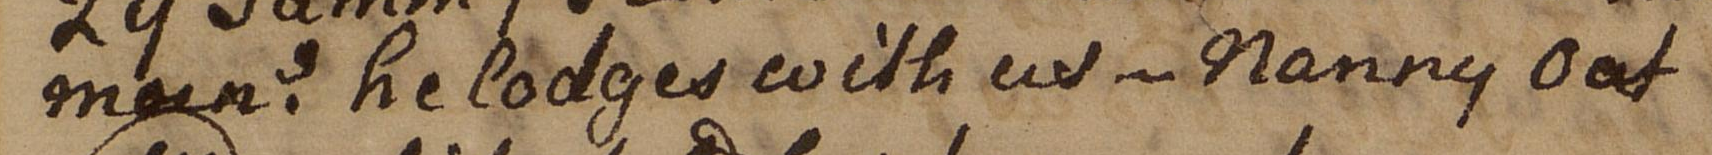morn^g. he lodges with us- Nanny out
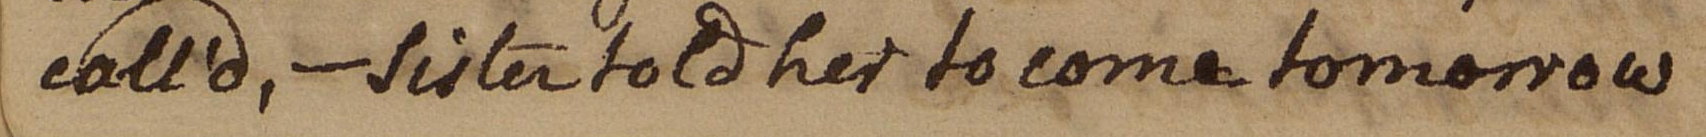call'd,- Sister told her to come tomorrow
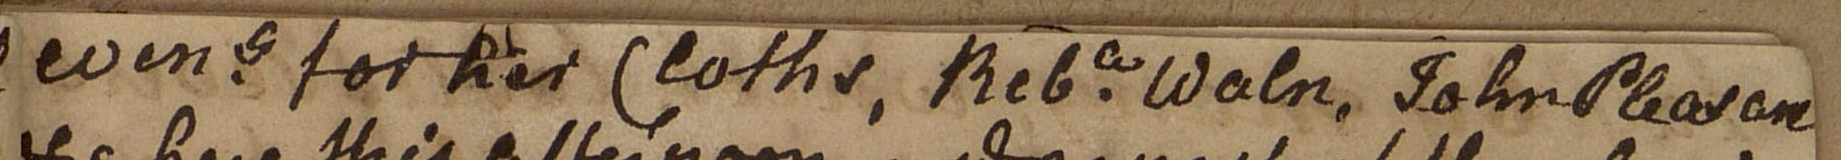even^g. for her Cloths, Reb^a. Waln, John Pleasan
